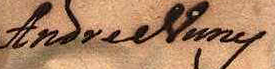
Andre Nunes
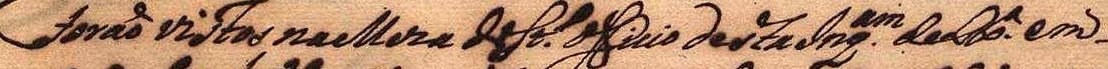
Foraõ vistas na Meza do st.o officio desta Inq.am de Lx.a em
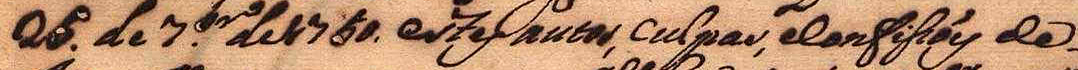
25. de 7.bro de 1750 estes autos, culpas e Confissões de
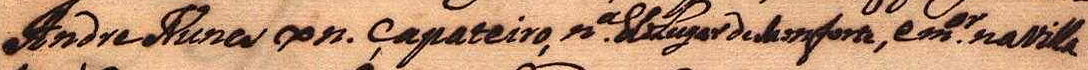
Andre Nunes xn. çapateiro, n.al do Lugar de Monforte, e m.or na villa
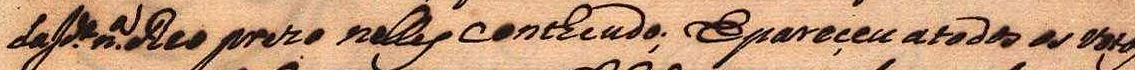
da J.da n.a Reo prezo nelles contheudo; E pareçeu a todos os votos
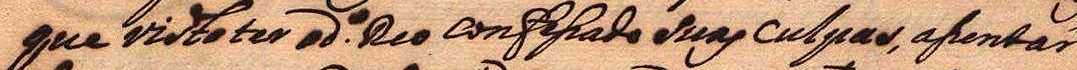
que visto ter o d.o Reo confessado suas culpas, asentar
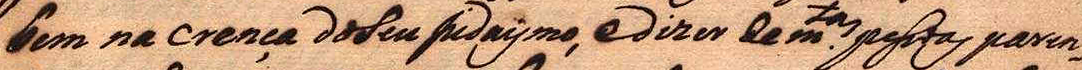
bem na crença do Seu Judaismo, e dizer de m.tas pessoas paren
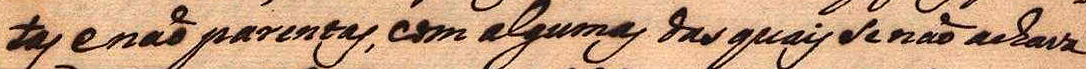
tas e naõ parentas, com algumas das quais se naõ achava
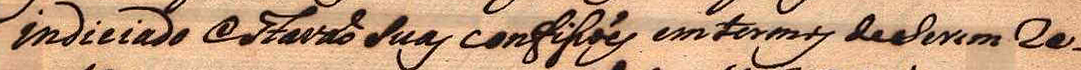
indiciado estavaõ suas confissões em termos de Serem Re
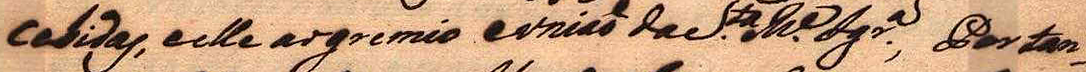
cebidas, e elle ao gremio e vniaõ da S.ta M.e Igr.a, Portan
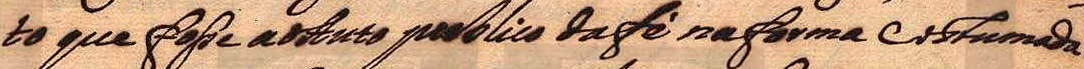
to que fosse ao Auto publico da fé na forma costumada
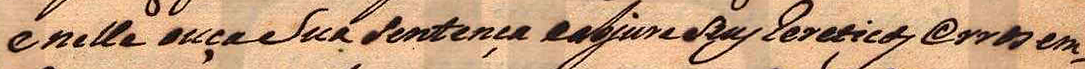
e nelle ouça Sua sentença e abjure seus hereticos erros em
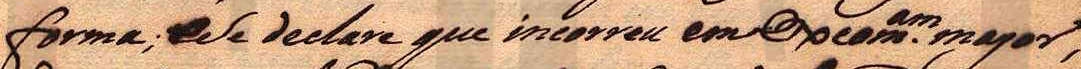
forma; e se declare que incorreu em Excom.am mayor,
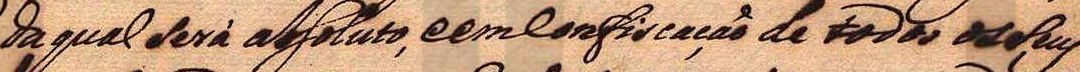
da qual será absoluto, e em Confiscaçaõ de todos os Seus
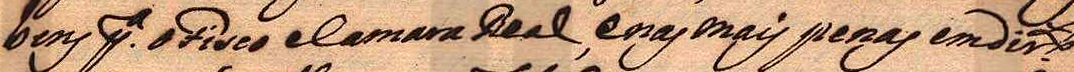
bens p.a o Fisco e Camara Real, e nas mais penas em dir.to
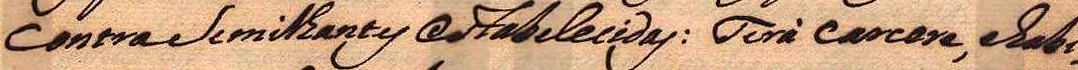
contra Semilhantes estabelecidas: Terá carcere, e habi
